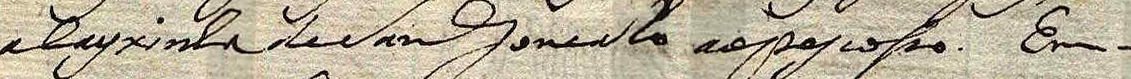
e Cayxinha de San Goncallo ao pescosso. Em
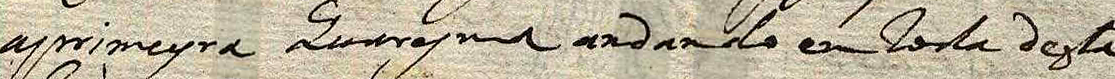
a primeyra Quaresma andando em Roda desta
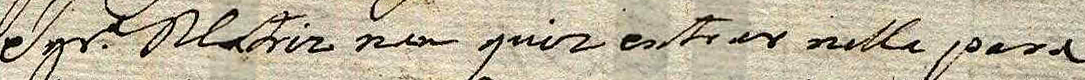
Igr.a Matriz nam quiz entrar nella para
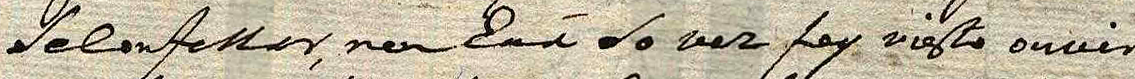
se confessar, nem huā so vez foy visto ouvir
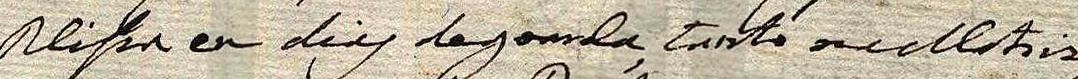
Missa en dias de goarda, tanto na Matriz,
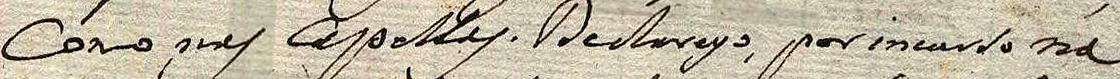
Como nas Capellas. Declareyo, por incurso na
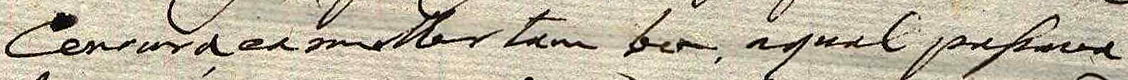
Censura, e a molher tambem, a qual passava
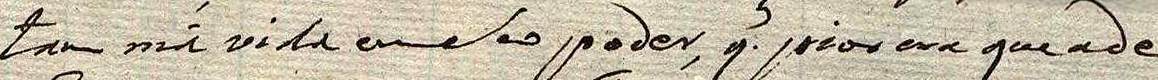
tam má vida en seo poder, q̄ pior era que a de
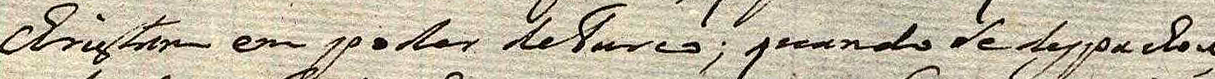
christam em poder de Turco; quando se despachou,
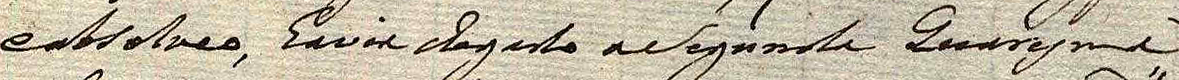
e absolveo, havia chegado a seguinte Quaresma
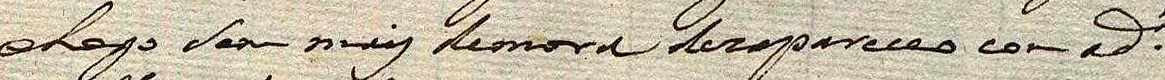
e Logo sem mais demora dezapareceo com a d.a
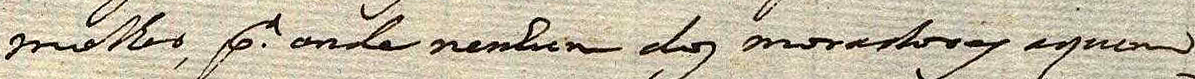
molher, p.a onde nenhum dos moradores a quem
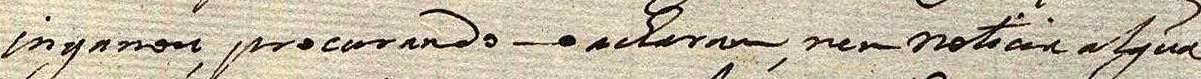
inganou, procurando-o acharam, nem noticia algūa
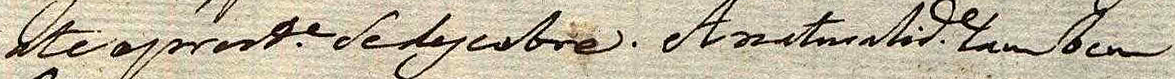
ate o prezt.e se descobre. A naturalid.e tambem
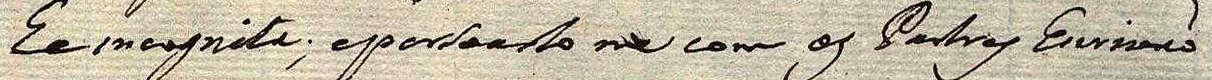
he incognita; e persoadome com os Padres Escrivaõ
